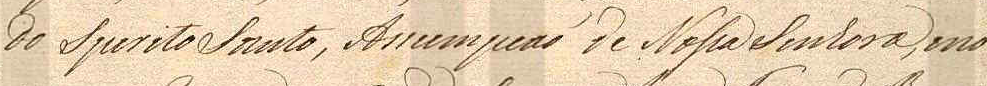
do Spirito Sancto, Assumpcaõ de Nossa Senhora, e no
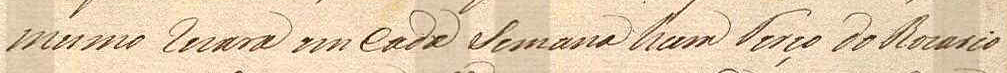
mesmo Rezara em cada semana hum Terço do Rozario
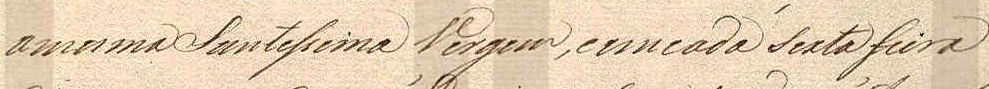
a mesma Santessima Vergem, e em cada sexta feira
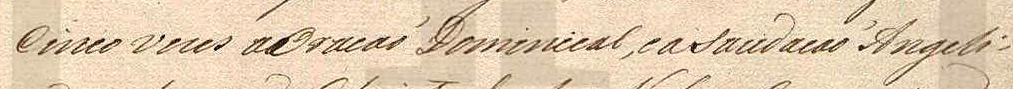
cinco vezes a Oraçaõ Dominical, e a saudacaõ Angeli
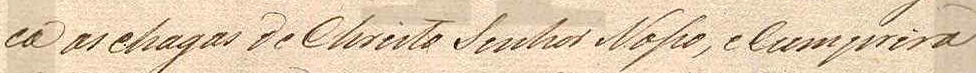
ca as chagas de Christo Senhor Nosso, e Cumprira
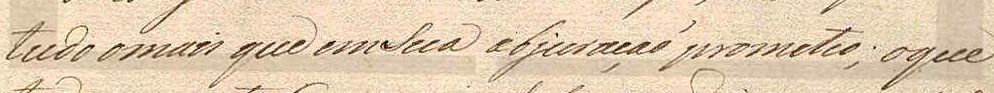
tudo o mais que em sua abjuraçaõ prometeo; o que
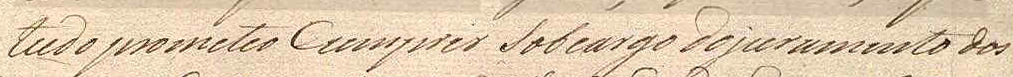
tudo prometeo Cumprir sob cargo do juramento dos
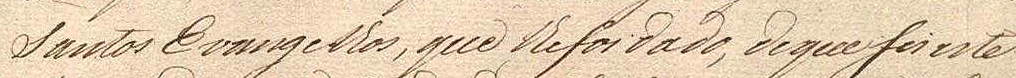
Santos Evangelhos, que lhe foi dado, de que fis este
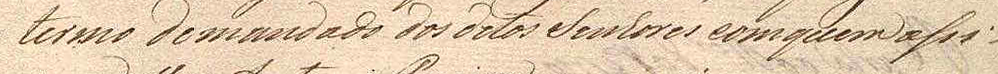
termo de mandado dos ditos Senhores com quem assi
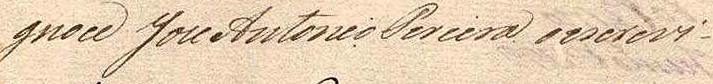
gnou Joze Antonio Pereira o escrevi
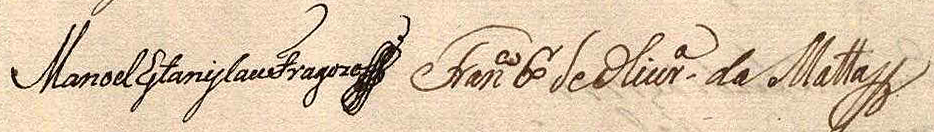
Manoel Estanislau Fragozo Fran.co X.r de Olivr.a da Matta
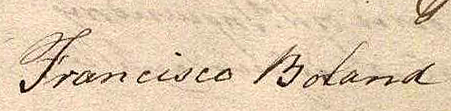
Francisco Boland
